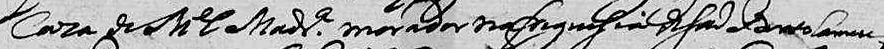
Caza de Mel Madr.a morador na freguesia de saõ Bartolameu
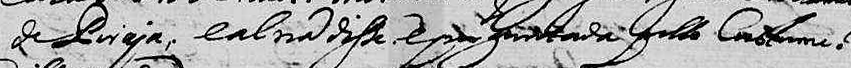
de Peraja, e al nā disse e perguntada pello Custume?
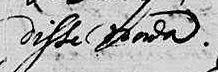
disse nada.
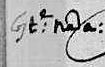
Coste: nada:
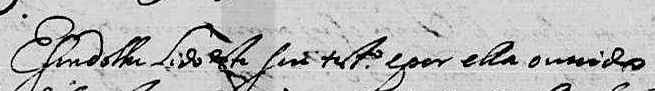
E sendolhe lido este seu test.o e por ella ouuido
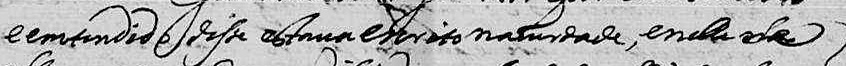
e emtendido disse estaua escrito na uerdade, e nelle se
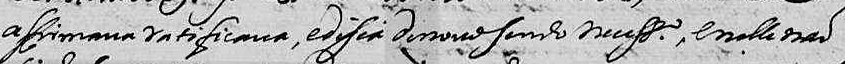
affirmaua ratificaua, e disia de nouo sendo necess.o, e nelle naõ
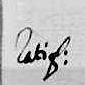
Ratif:
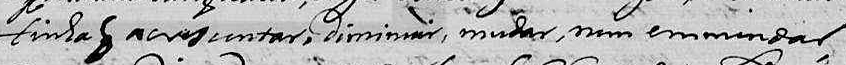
tinha q̄ acrescentar, diminuir, mudar, nem emmendar,
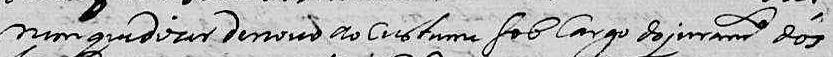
nem que dizer de nouo ao custume sob cargo do juramto dos
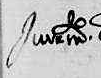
Juramto.
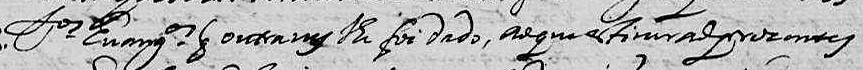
Stos. Euang.os q̄ outra ues lhe foi dado, ao que estiueraõ prezentes
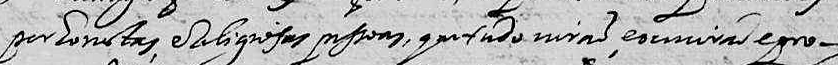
por honestas, e Religiosas pessoas, que tudo uiraõ, e ouuiraõ e pro
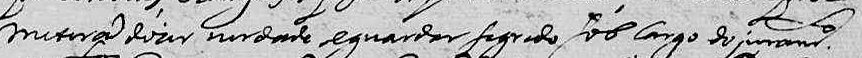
meteraõ dizer uerdade e guardar segredo sob cargo do juramto.
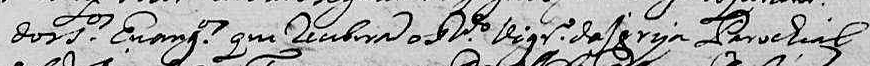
dos s.tos Euang.os que Receberā o R.do Vigr.o da Jgreja Parochial
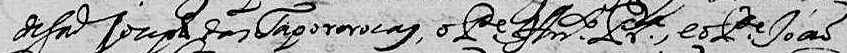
de Saõ Jozeph das Tapororocas, o P.e An.to Pr.a, e o P.e Joaõ
